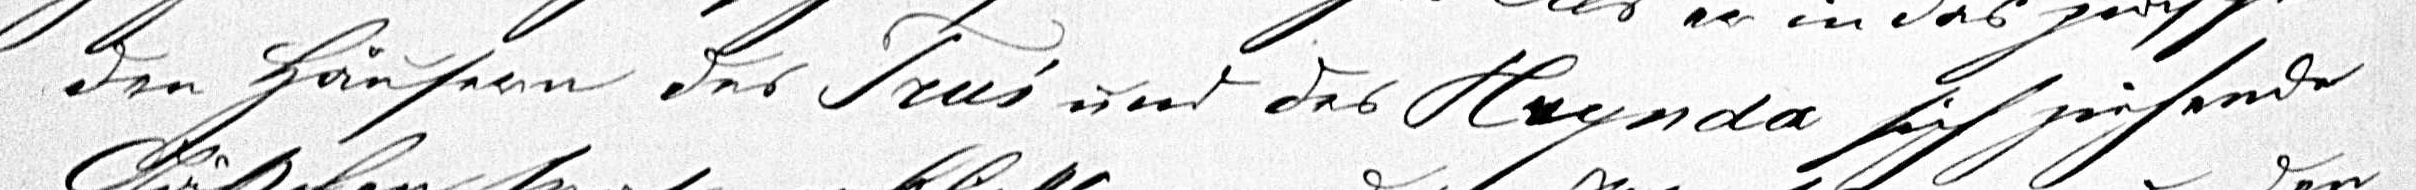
den Häusern des Tru's und des Hrynda sich ziehende
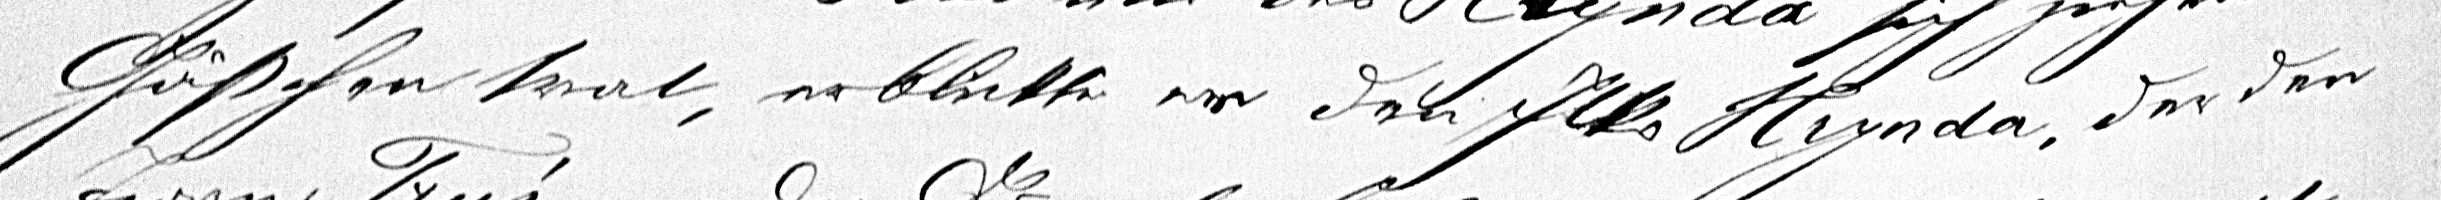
Gäßchen trat, erblickte er den Jlko Hrynda, der den
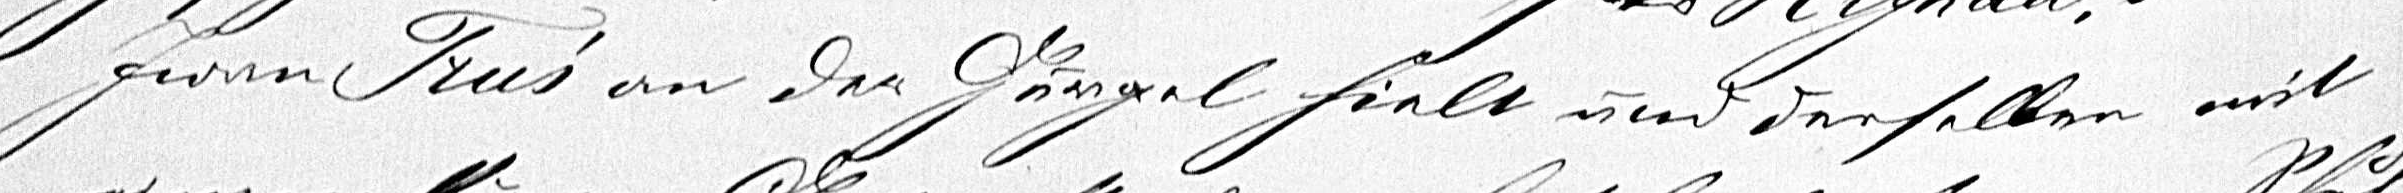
Jwan Tru's an der Gurgel hielt und derselben mit
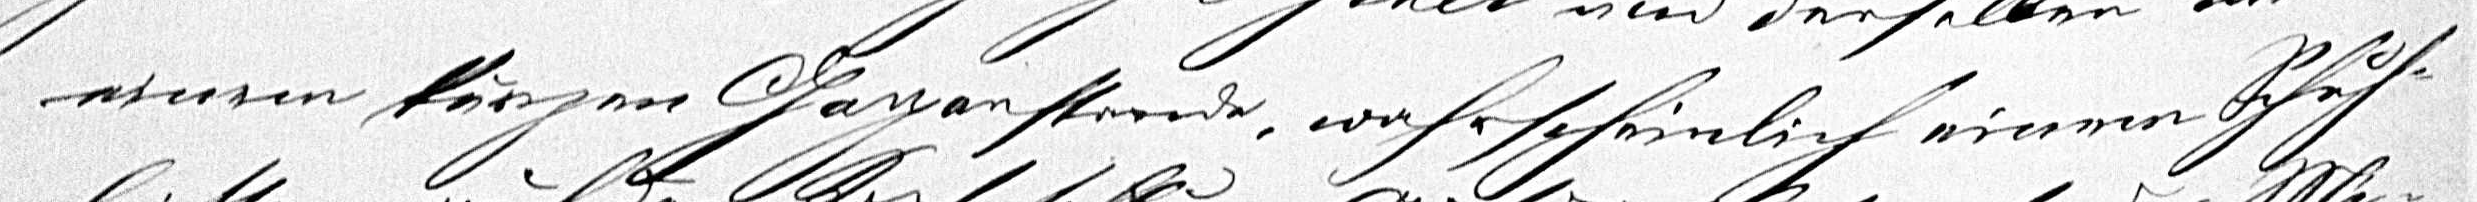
einem kurzen Gegenstande, wahrscheinlich einem Schuh¬
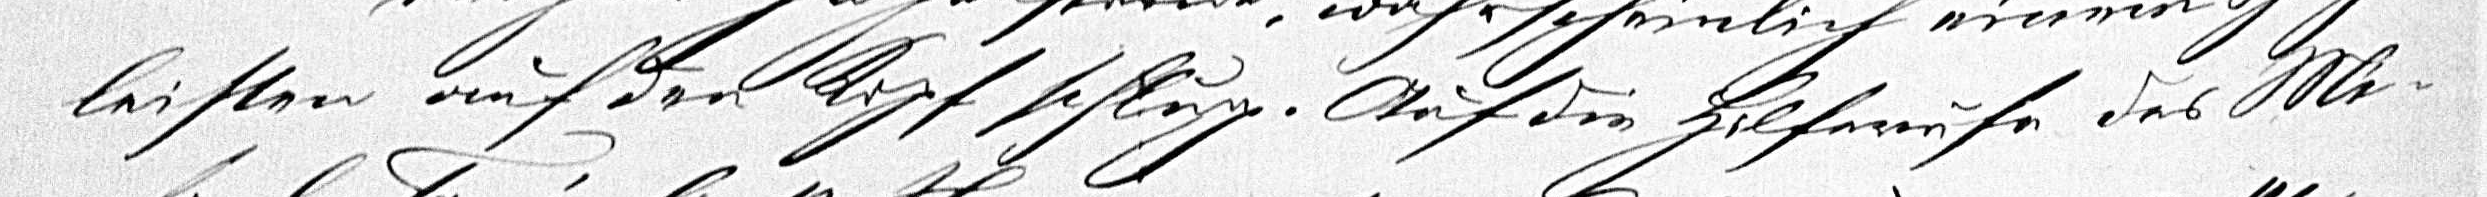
leisten auf den Kopf schlug. Auf die Hilferufe des Mi¬
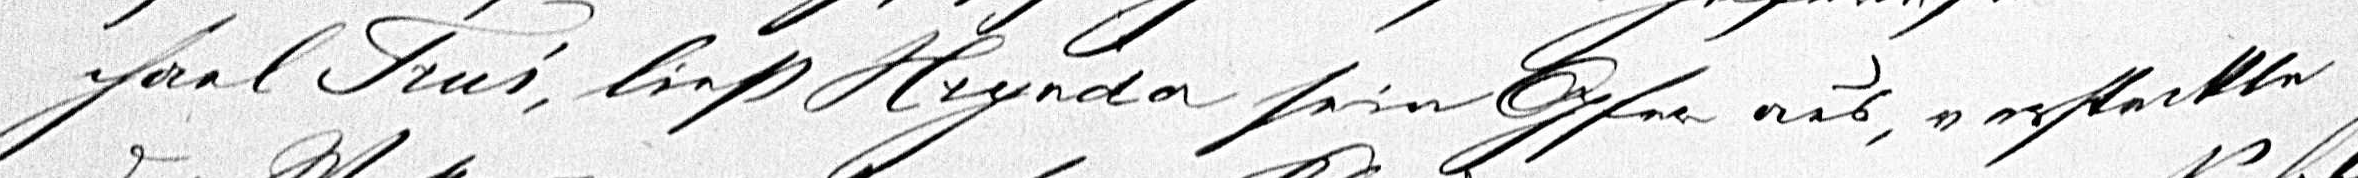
chael Tru's, ließ Hrynda sein Opfer aus, ersteckte
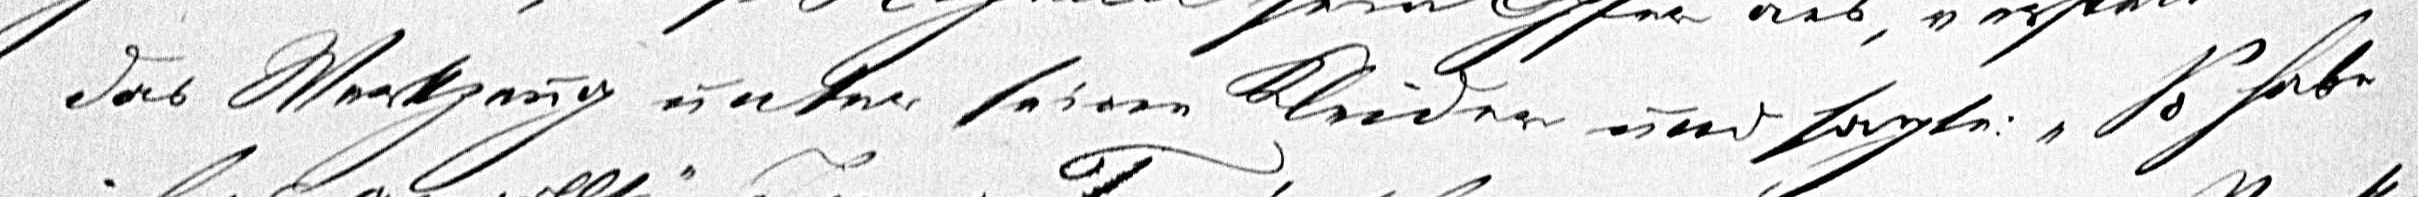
das Werkzeug unter seine Kleider und sagte: „ So habe
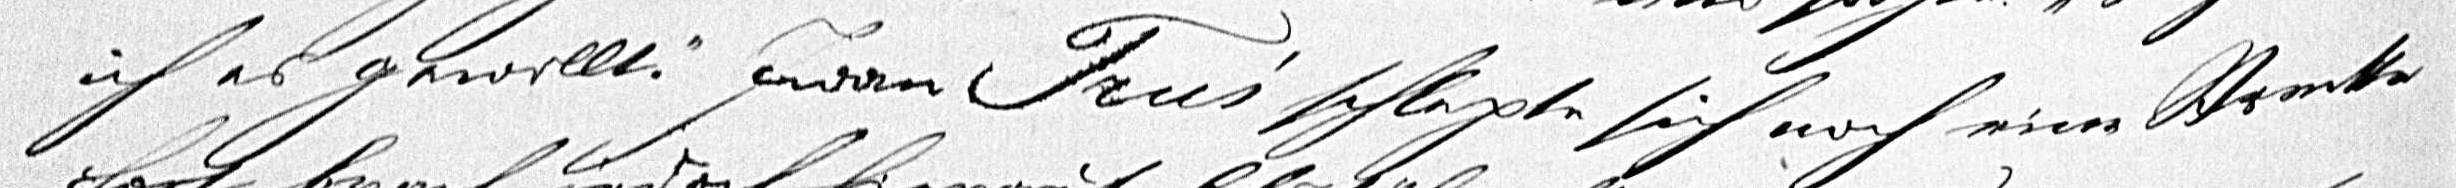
ich es gewollt." Jwan Tru's schlepte sich noch eine Brecke
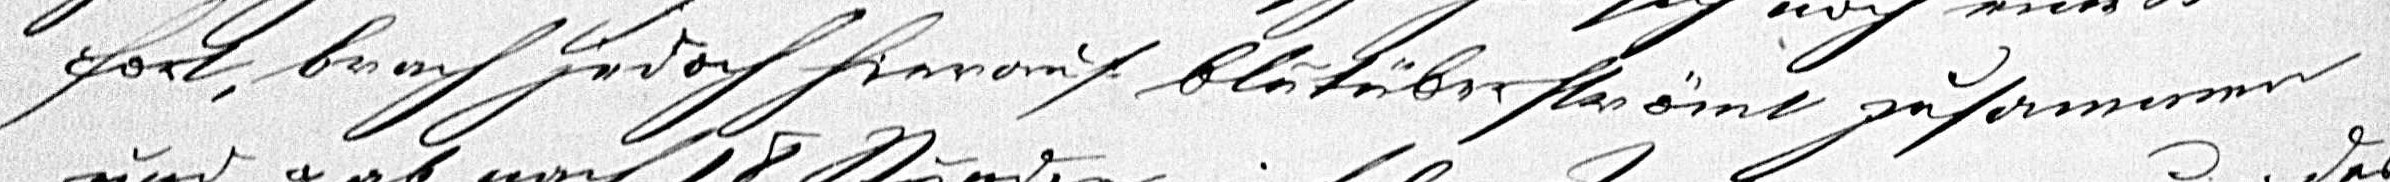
fort, brach jedoch hierauf blutüberxx zusammen
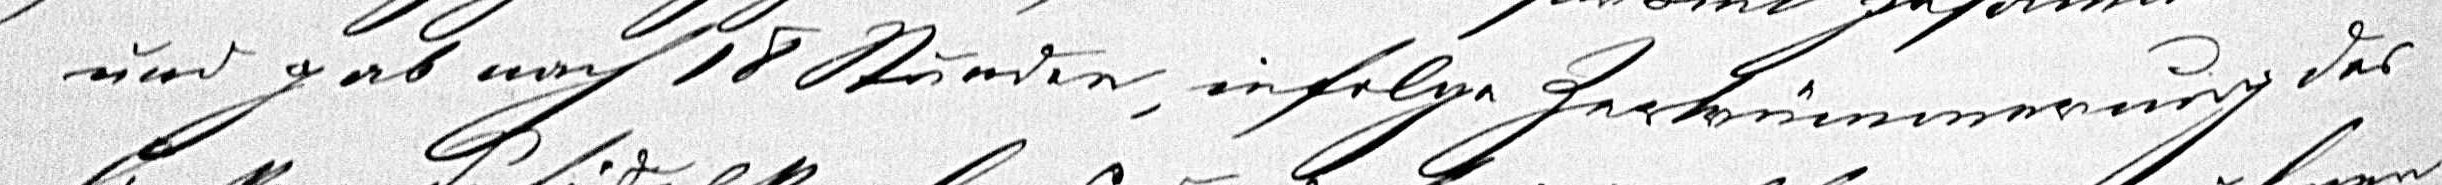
und gab nach 18 Stunden, infolge Zertrümmerung des
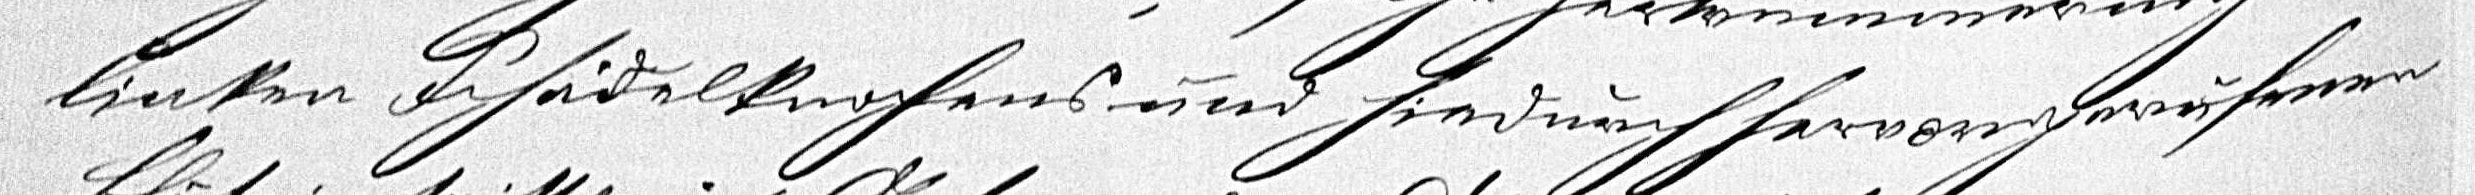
linken Schädelknochens und hindurch hervorrgerufenen
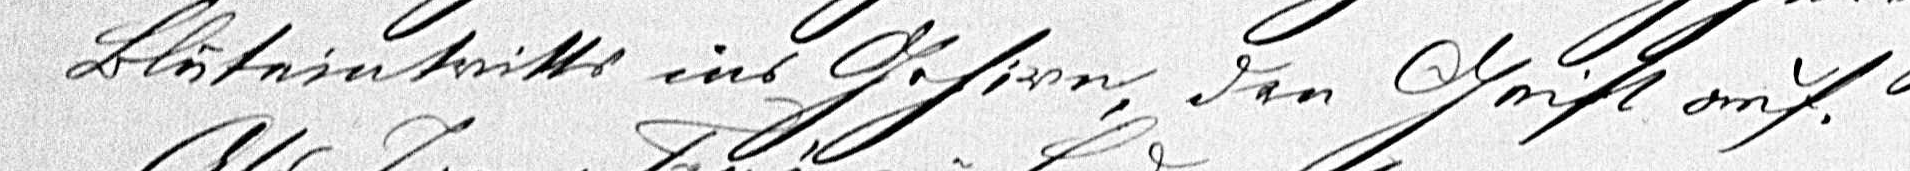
Bluteintritts ins Gehirn, den Geist auf.
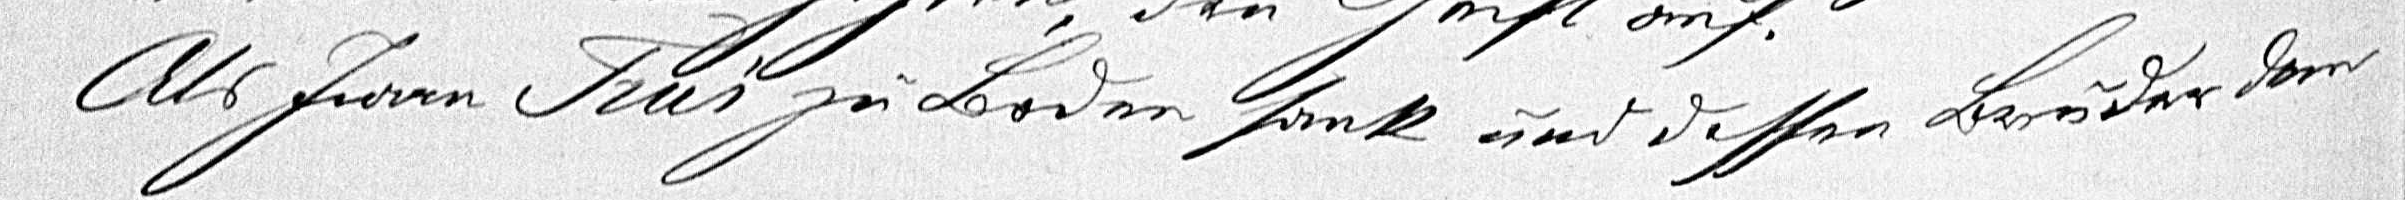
Aus Jwan Tru's zu Boden sank und dessen Bruder dem
